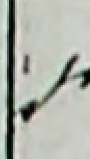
do
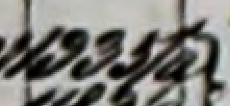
1335/a
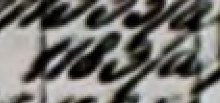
1183/a
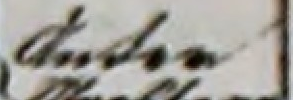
An der
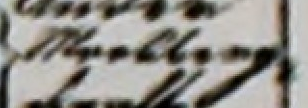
Marsberg„
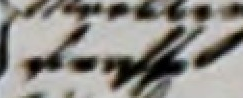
straffe
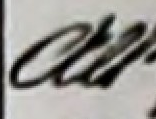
Alt
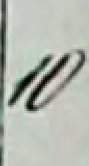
10
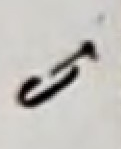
5
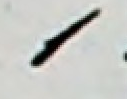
1
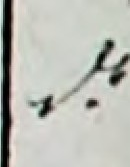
do
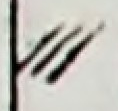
111
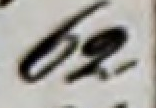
62
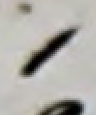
1
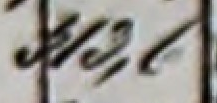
513,6
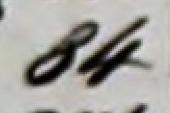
84
